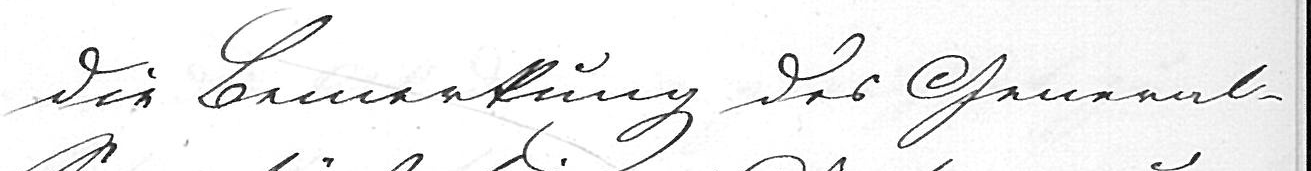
die Bemerkung des General-
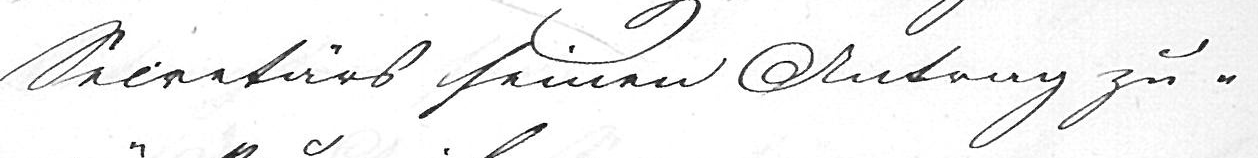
Secretärs seinen Antrag zu-
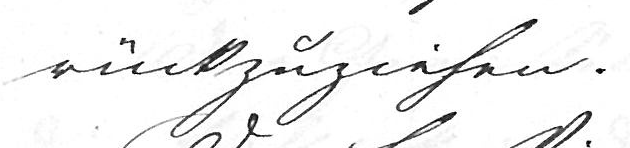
rückzuziehen.
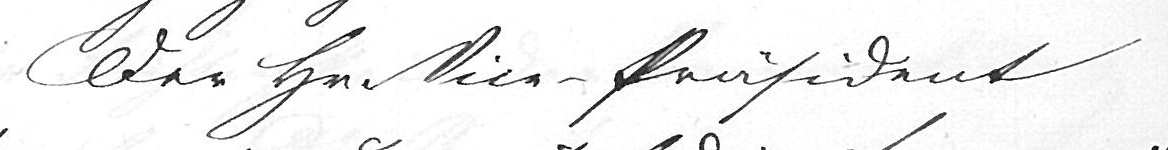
Der Hr. Vice-Präsident
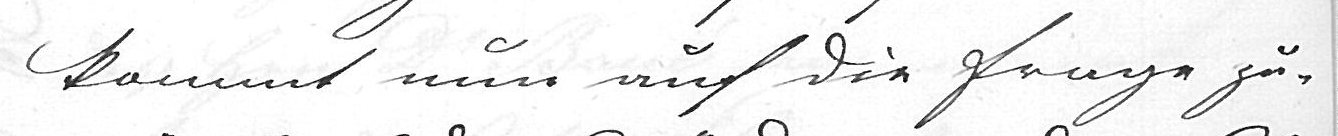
kommt nun auf die Frage zu-
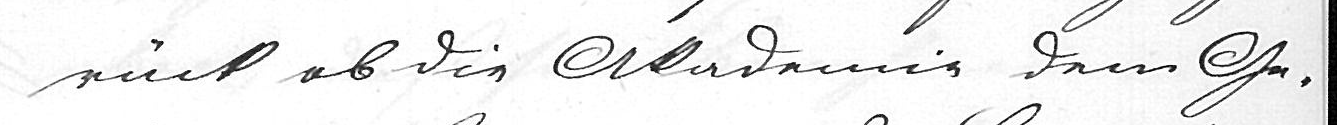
rück ob die Akademie dem Ge-
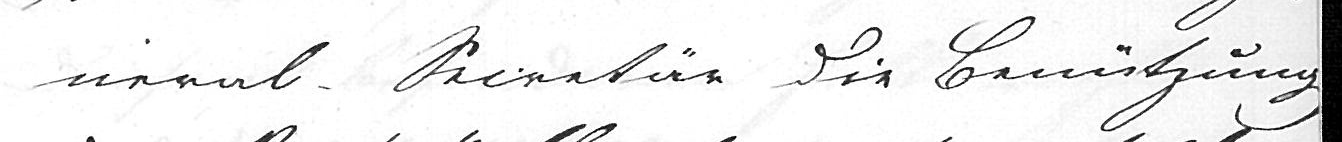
neral-Secretär die Benützung
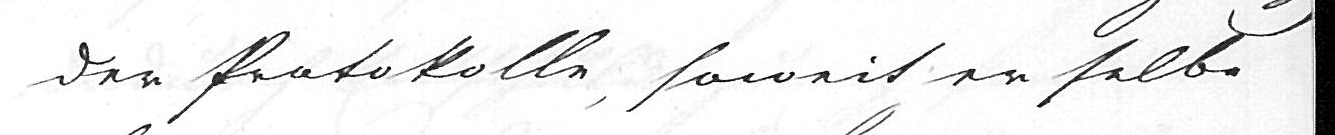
der Protokolle, soweit er selbe
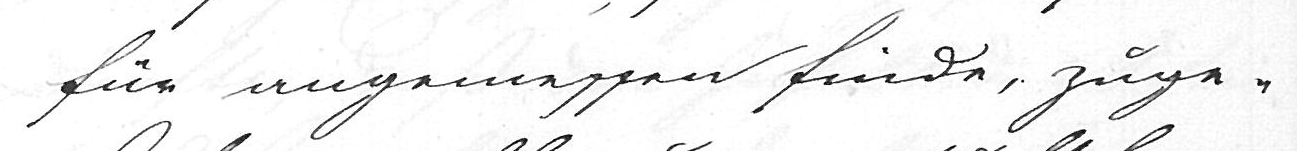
für angemessen finde, zuge-
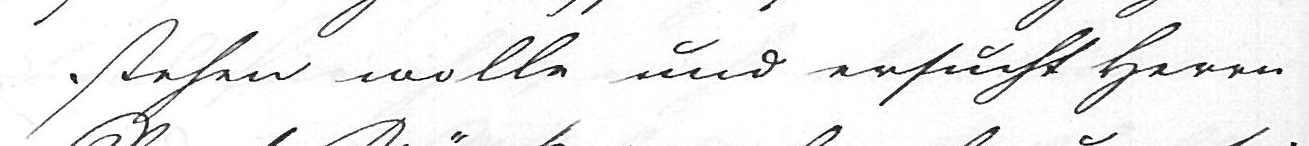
stehen wolle und ersucht Herrn
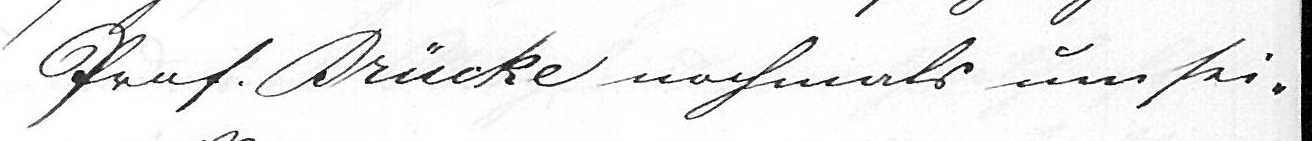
Prof. Brücke nochmals um sei-
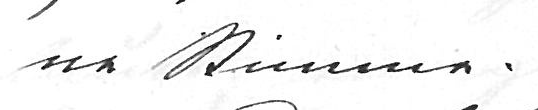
ne Stimme.
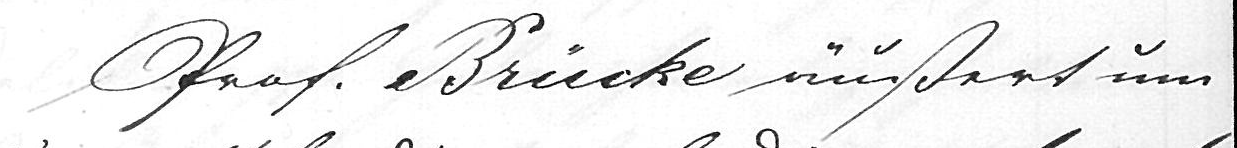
Prof Brücke äußert um
